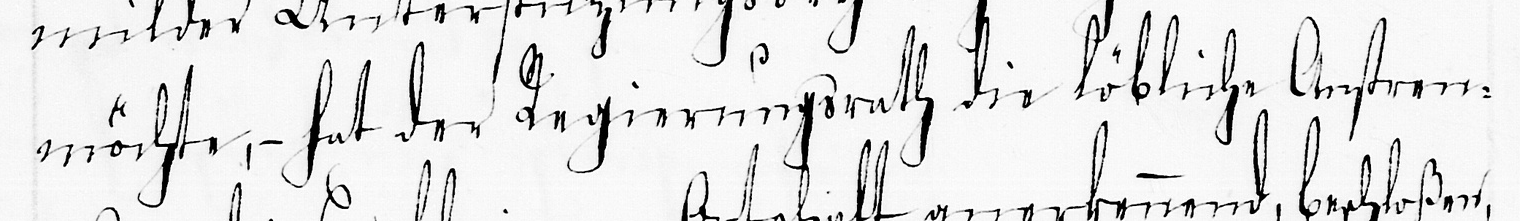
möchte, – hat der Regierungsrath die löbliche Anstren¬
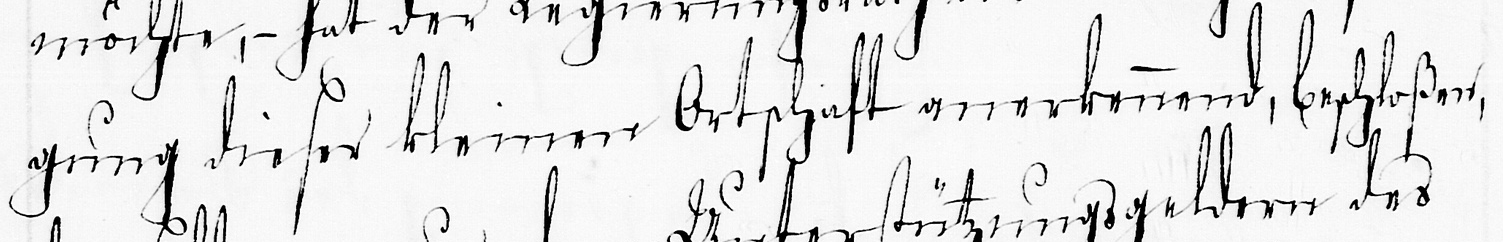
gung dieser kleinen Ortschaft anerkennend, beschloße¬
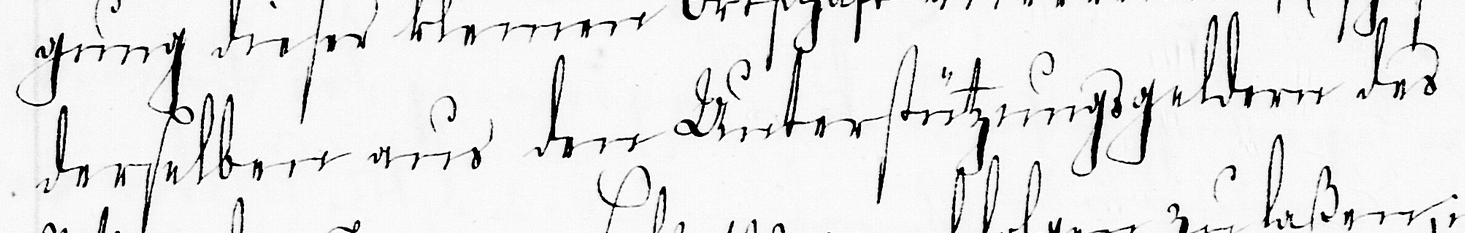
derselben aus den Unterstützungsgeldern des
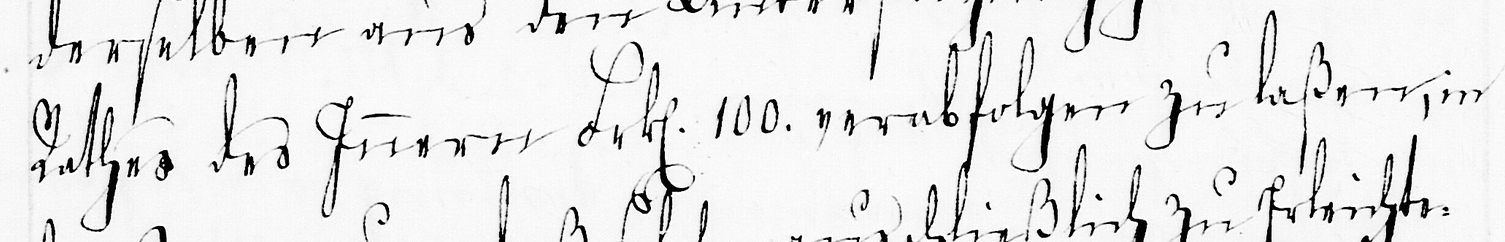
Rathes des Innern Frk[en]. 100. verabfolgen zu laßen, in
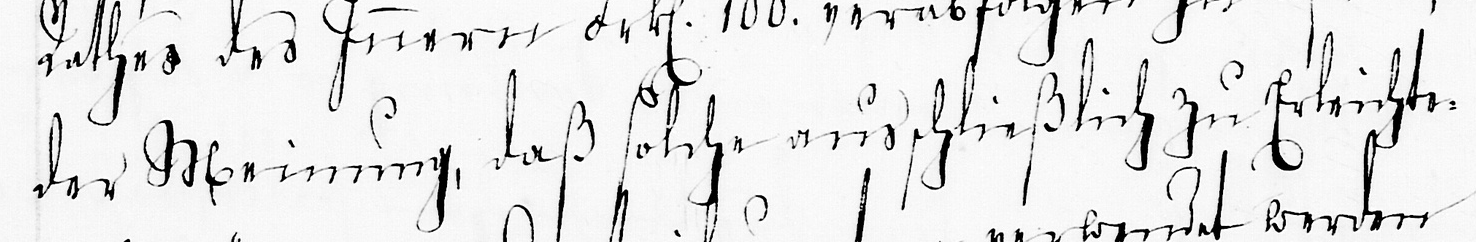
der Meinung, daß solche ausschließlich zu Erleichte¬
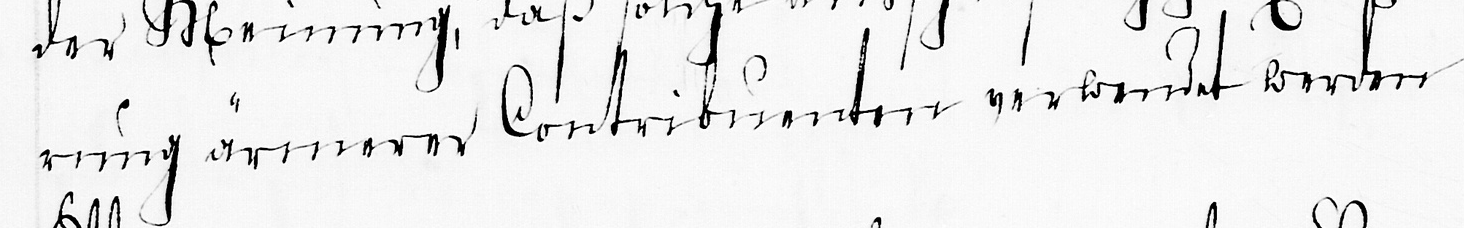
rung ärmerer Contribuenten verwendet werden
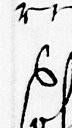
s¬
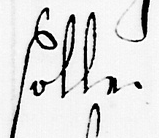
olle.
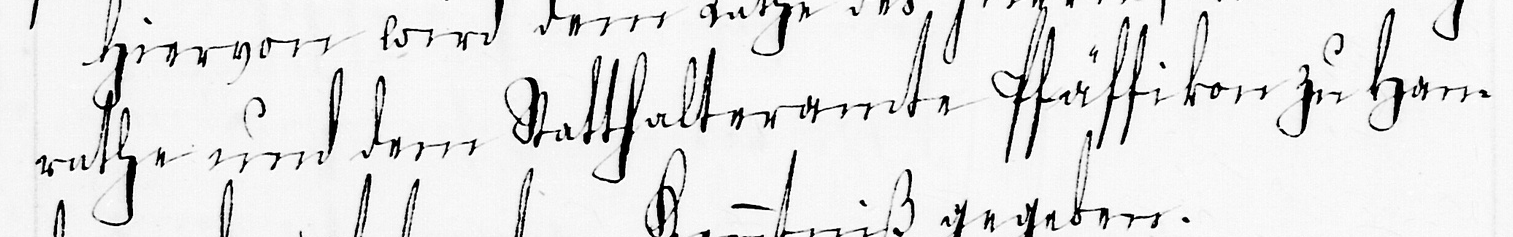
rathe und dem Statthalteramte Pfäffikon zu Han¬
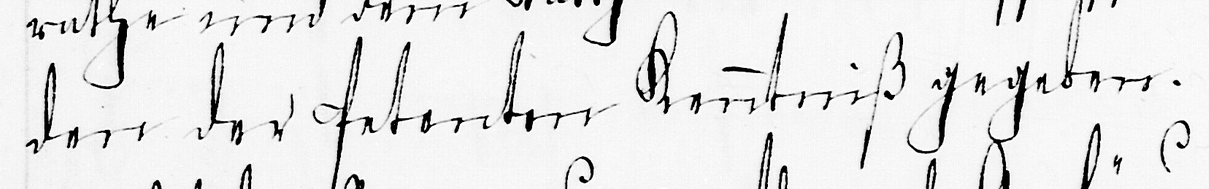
den der Petenten Kenntniß gegeben.
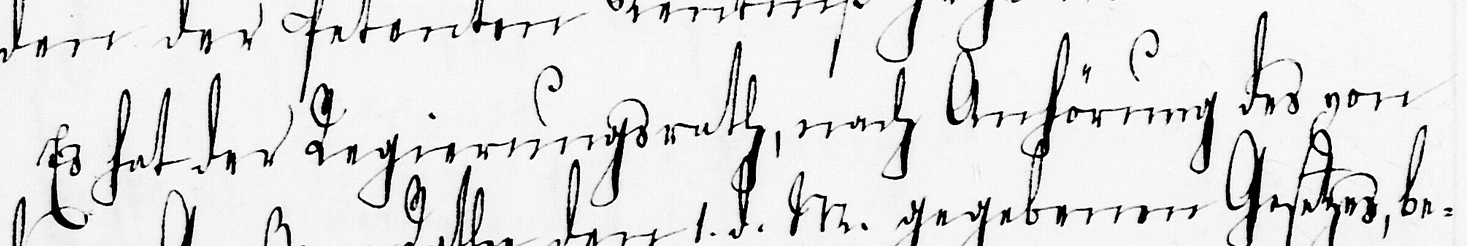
Es hat der Regierungsrath, nach Anhörung des von
